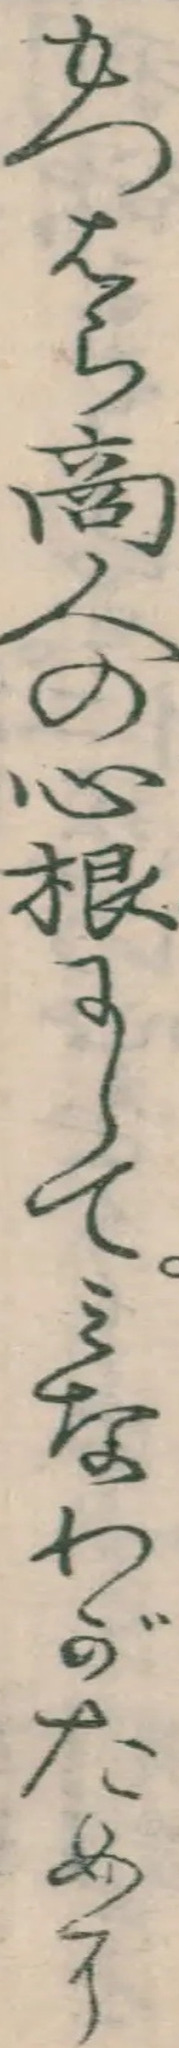もつはら商人の心根にして。みなわがために
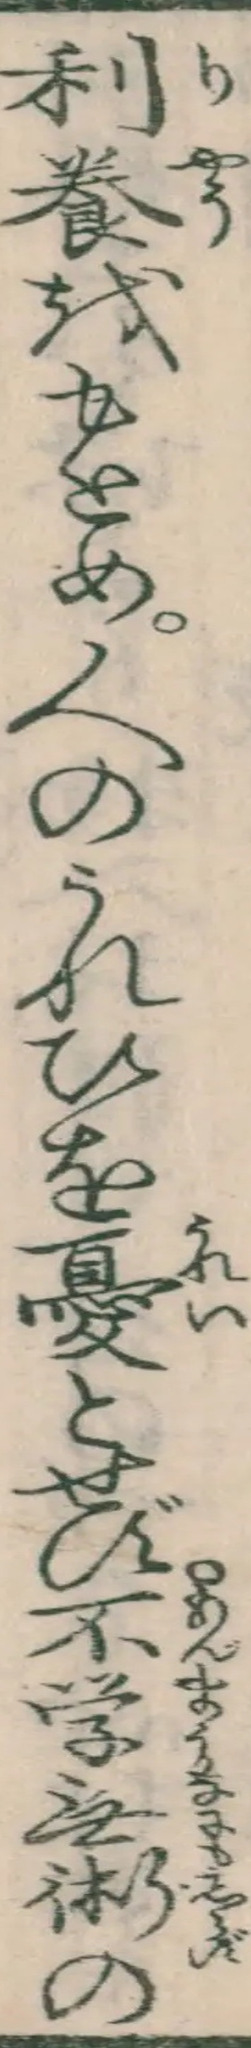利養をもとめ。人のうれひを憂とせず。不学無術の
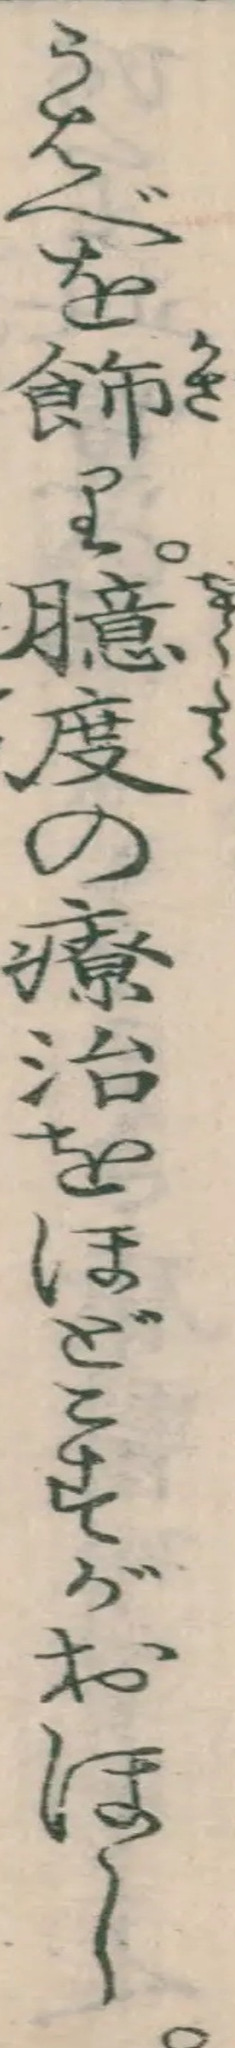うはべを飾り。臆度の療治をほどこすがおほし。
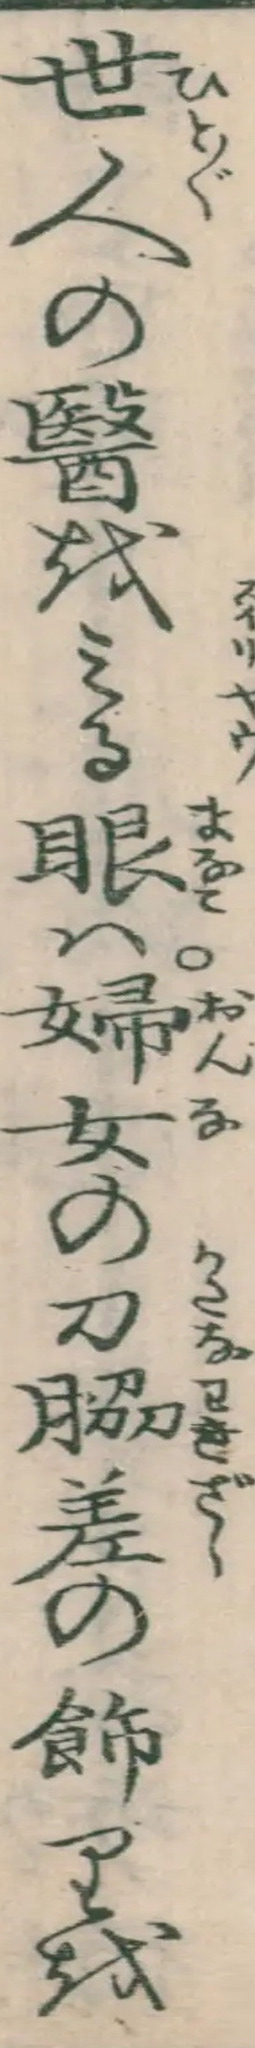世人の醫をみる眼は。腐女の刀脇差の飾りを
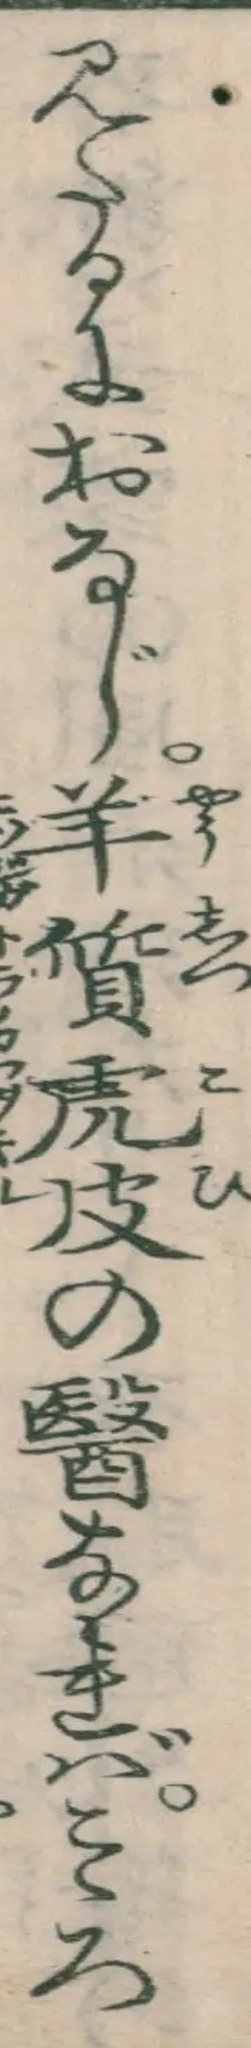見たるにおなじ。羊質虎皮の醫なれば。こゝろ
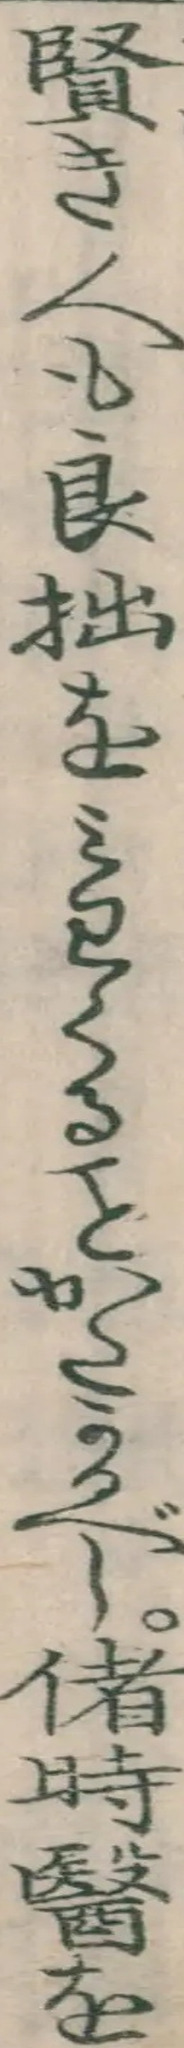賢き人も良拙をみわくることかたかるべし。偖時醫を

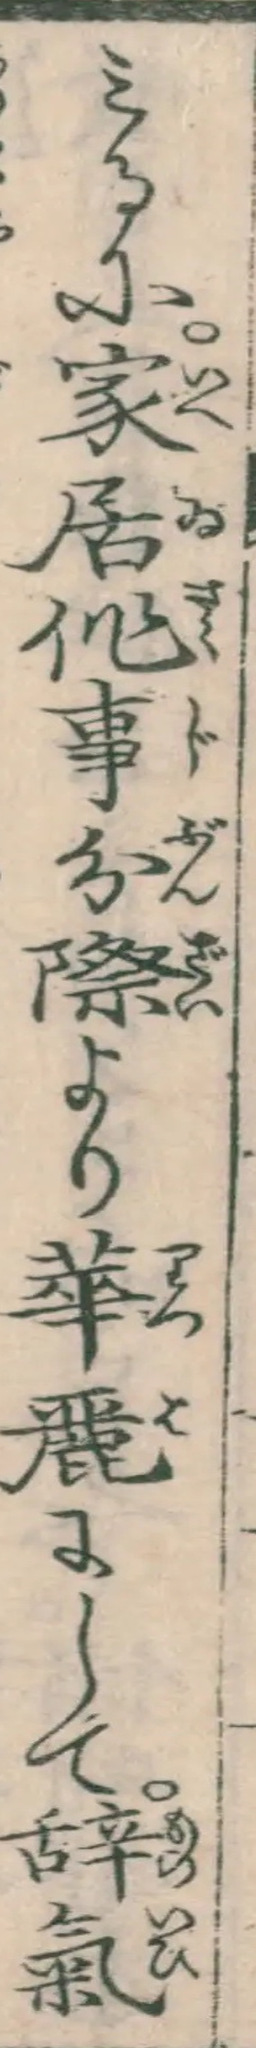みるに。家居作事分際より華麗にして。辞氣
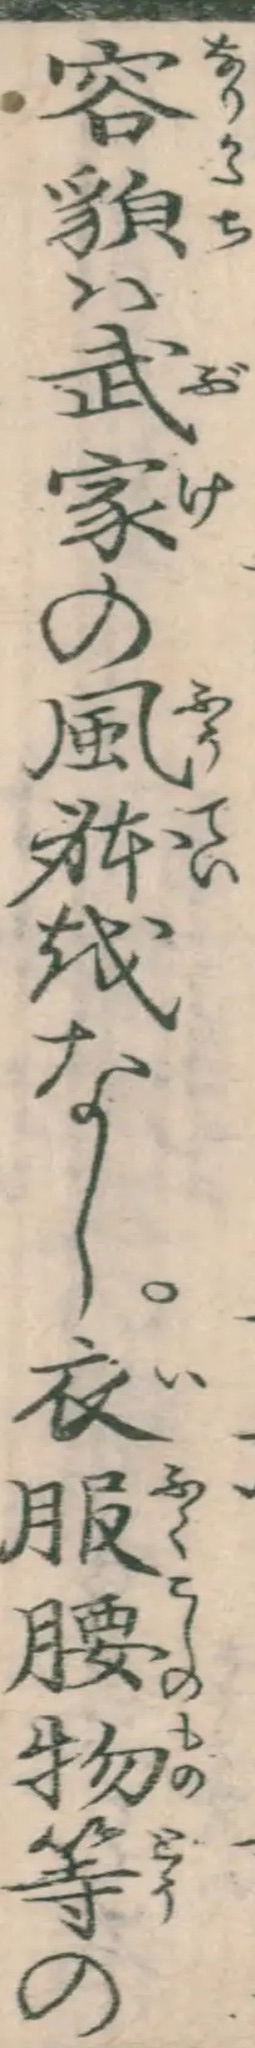容貌は武家の風体をなし。衣服腰物等の
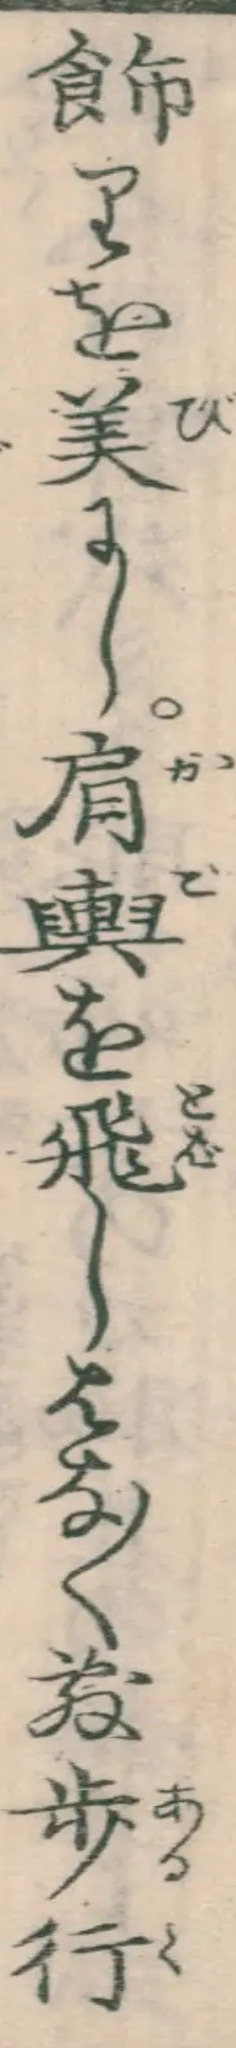飾りを美にし。肩輿を飛しはな〳〵敷歩行
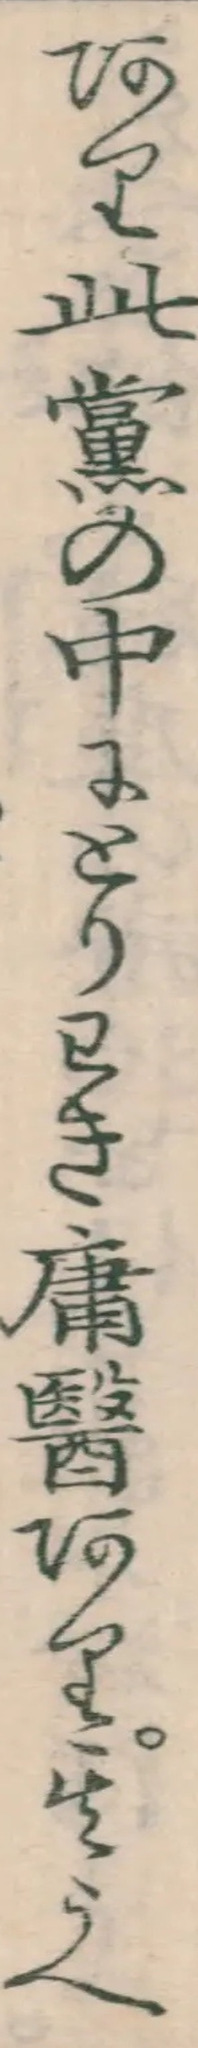あり。此黨の中にとりわき庸醫あり。其うへ
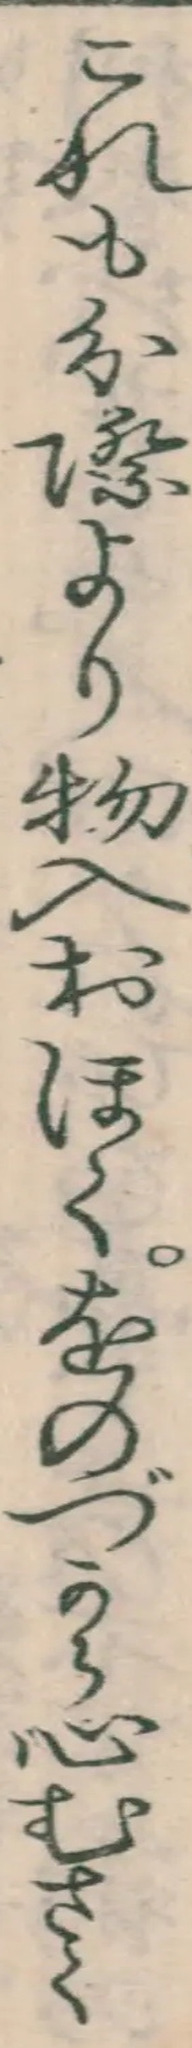これも分際より物入おほく。をのづから心むさく
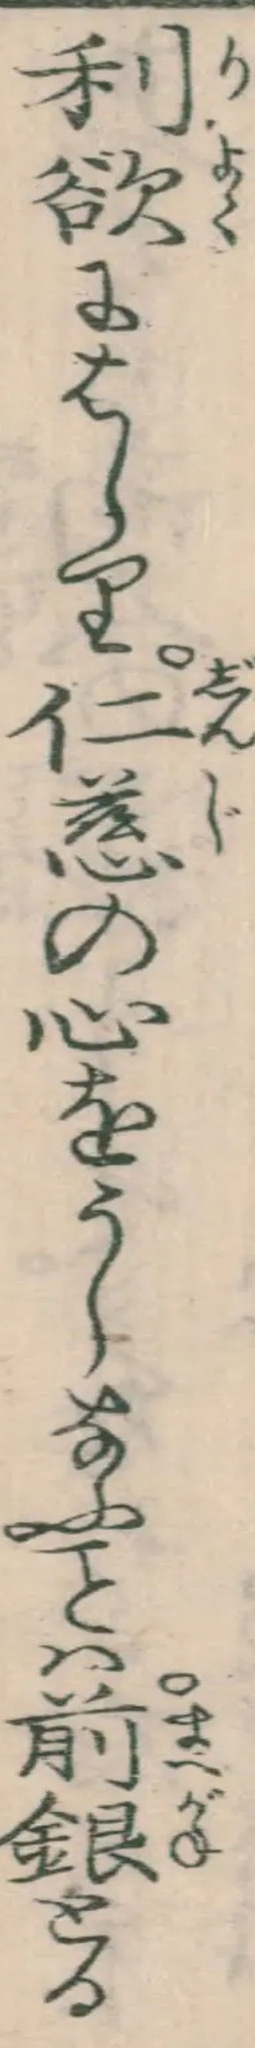利欲にはしり。仁慈の心をうしなふことは。前銀とる
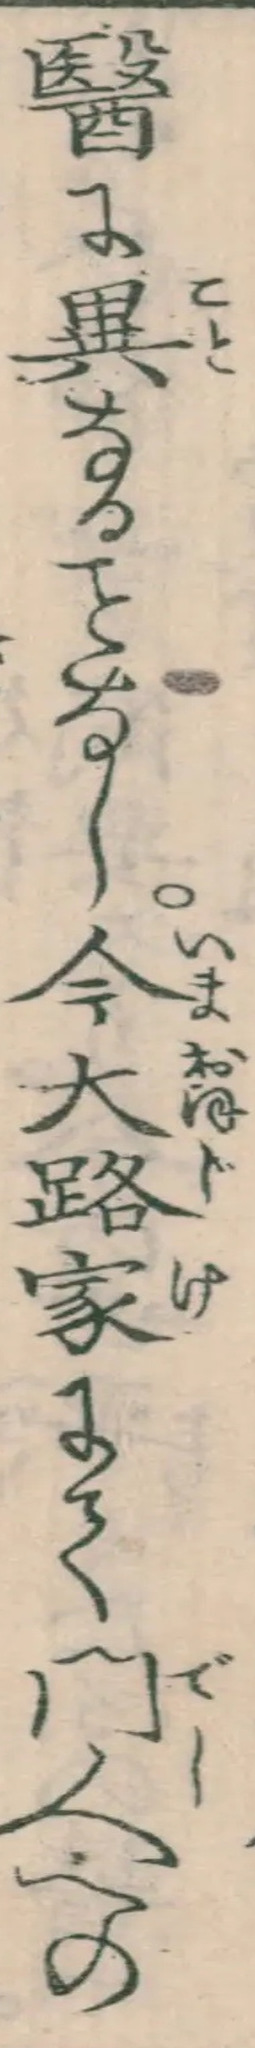醫に異なることなし。今大路家にて門人への
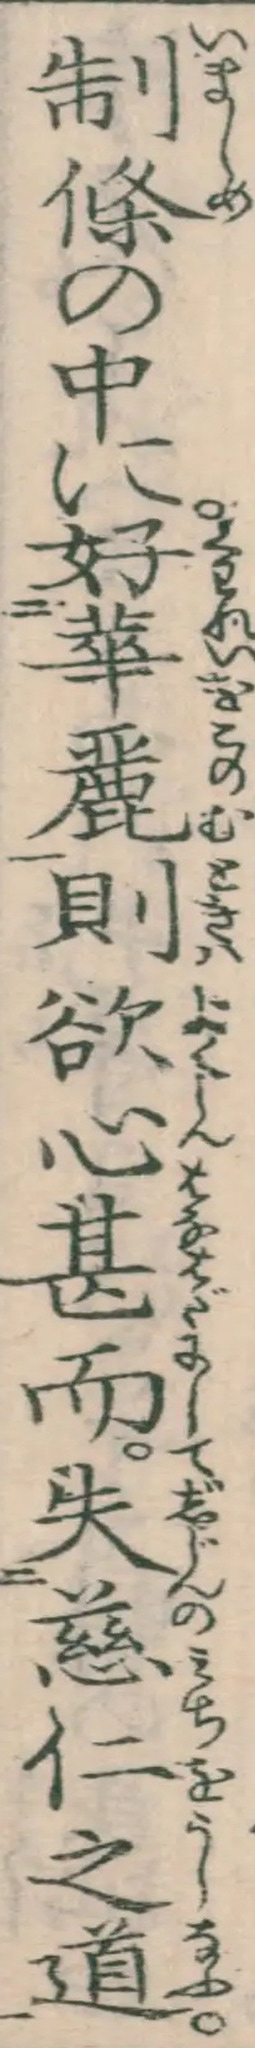制條の中に。好華麗則欲心甚而。失慈仁之道。
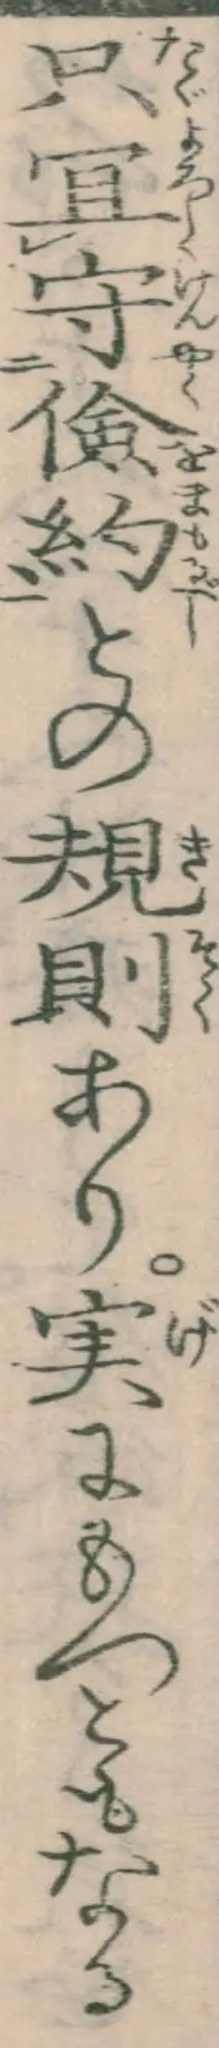只宜守倹約との規則あり。実にもつともなる
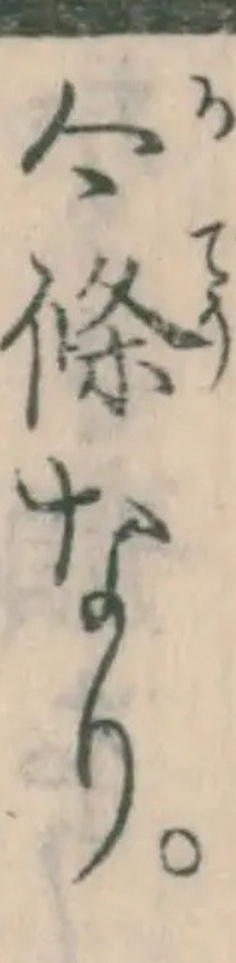カ條なり。
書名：瘡家示訓
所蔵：国立国会図書館 National Diet Library, JAPAN
